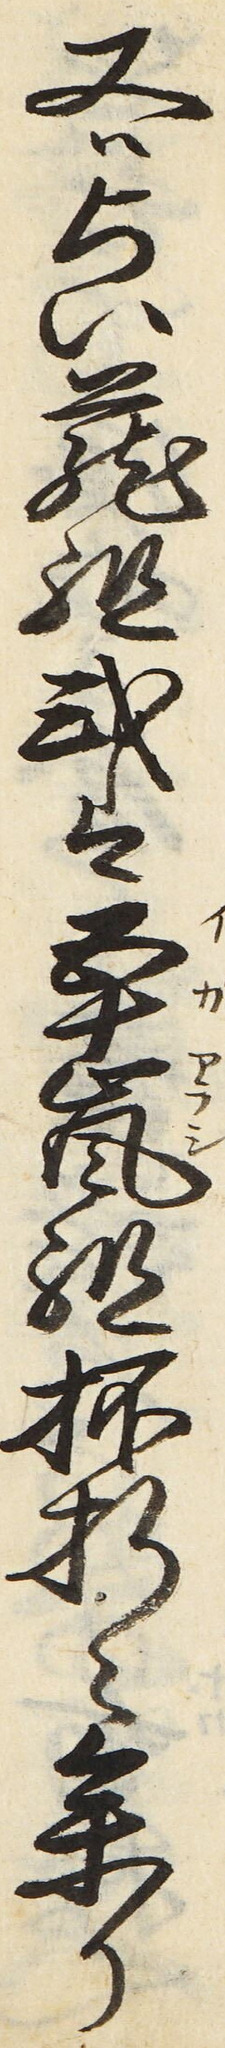又はらい蔵組或は五十嵐組抔折々参り
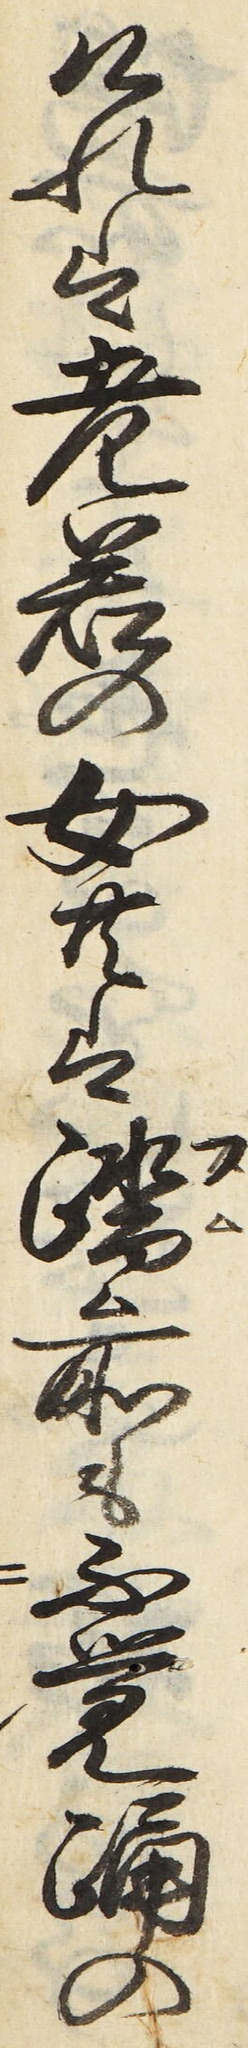けれは老若の女共は踏む所も不覚踊の

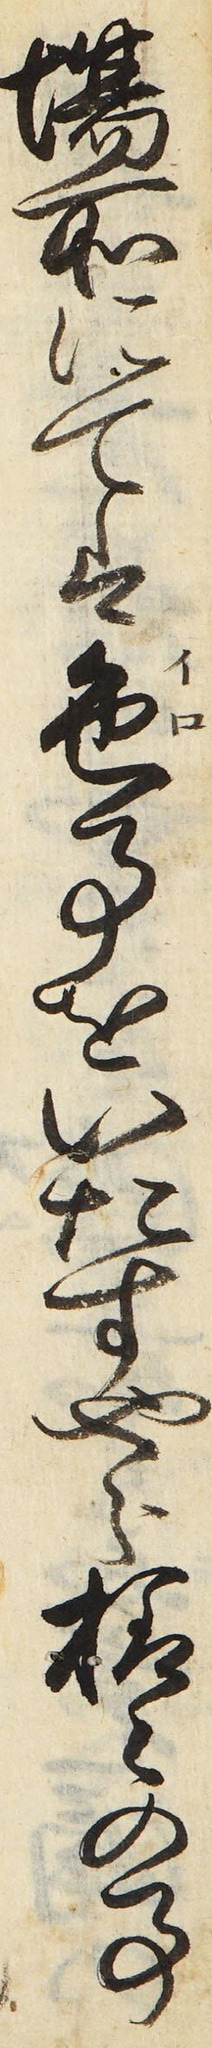場所にては色事をいたすやら様々の事
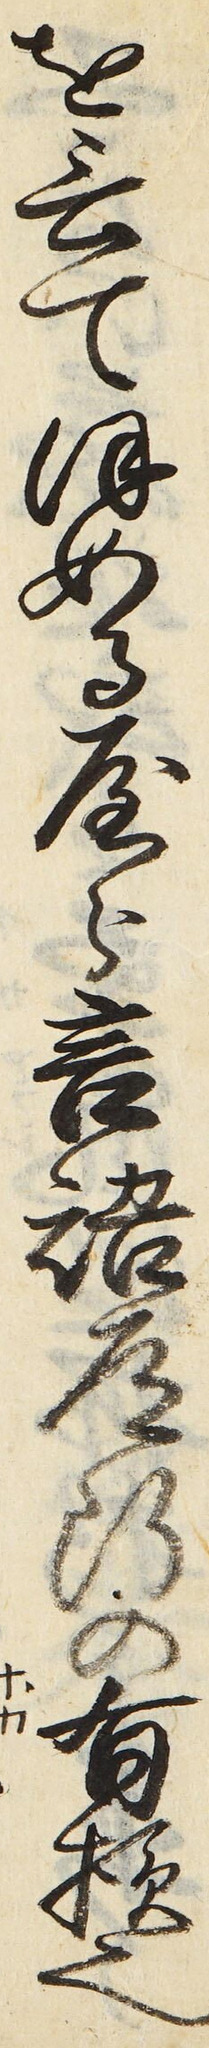を云てほめるやら言語道断の有様也
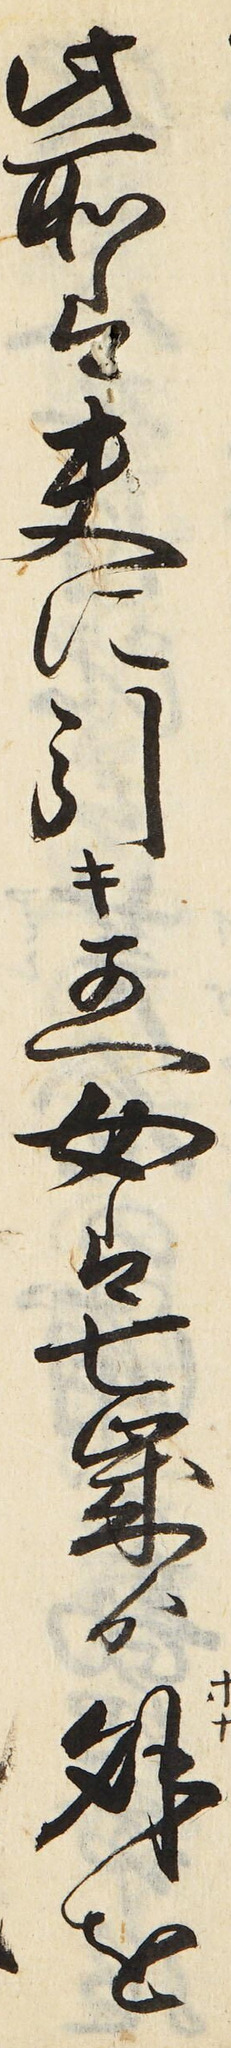此所は夫に引きかへ女は七歳より外を
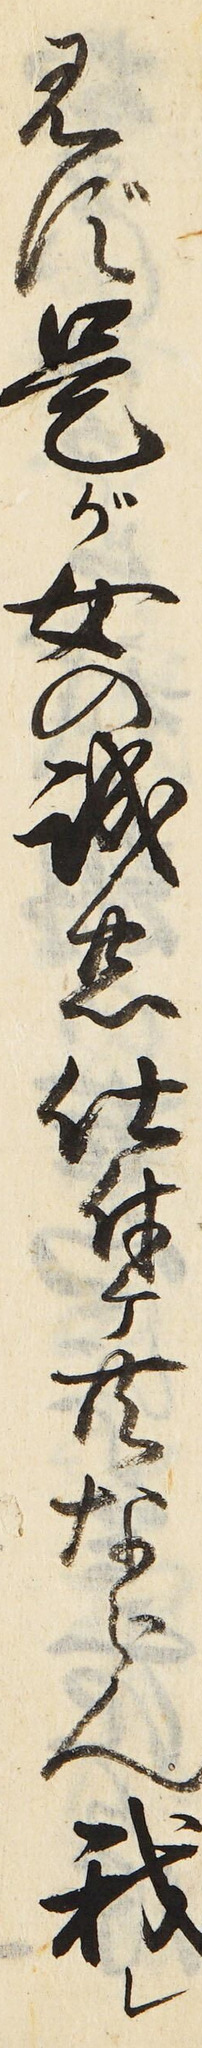見ず是が女の誠の仕付け共ならん我れ
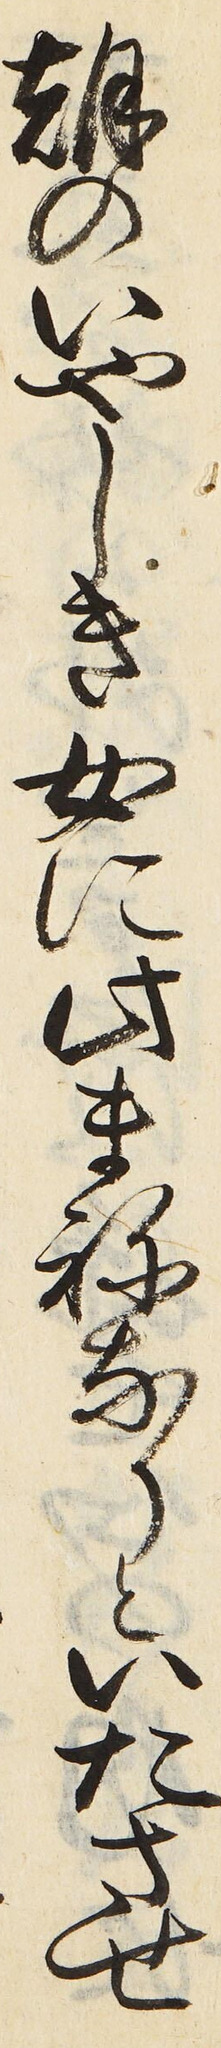朝のいやしき女に此まねなりといたさせ
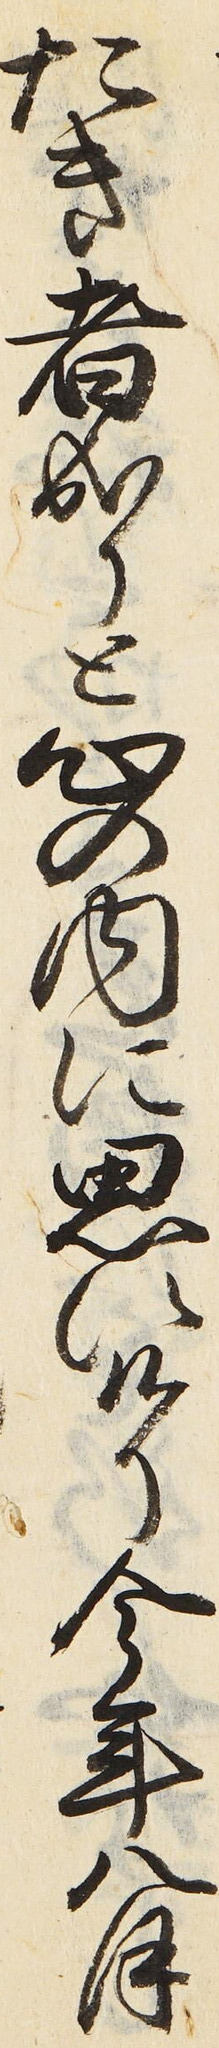たき者成りと心の内に思ひけり今年八月
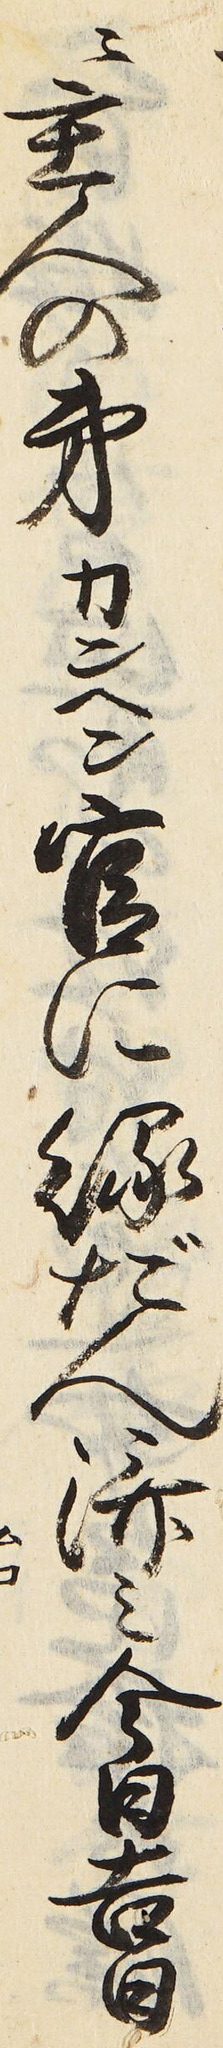に主人の弟カンへン官に縁だん済み今日吉日
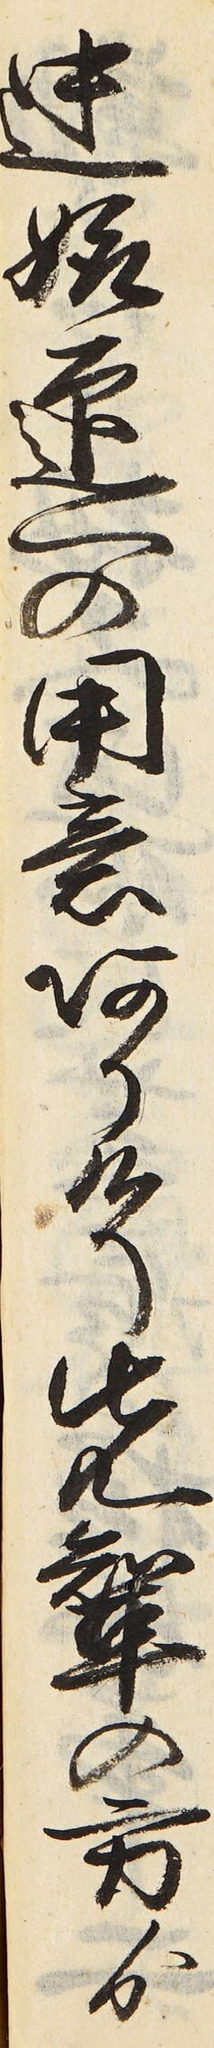迚娵迎ヘの用意ありけり先聟の方ゟ
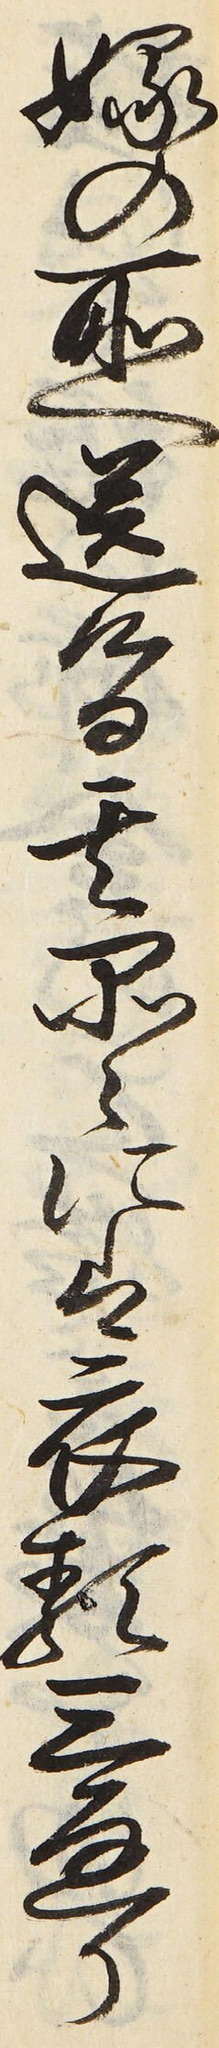嫁の所へ送ける其品々には衣類三通り
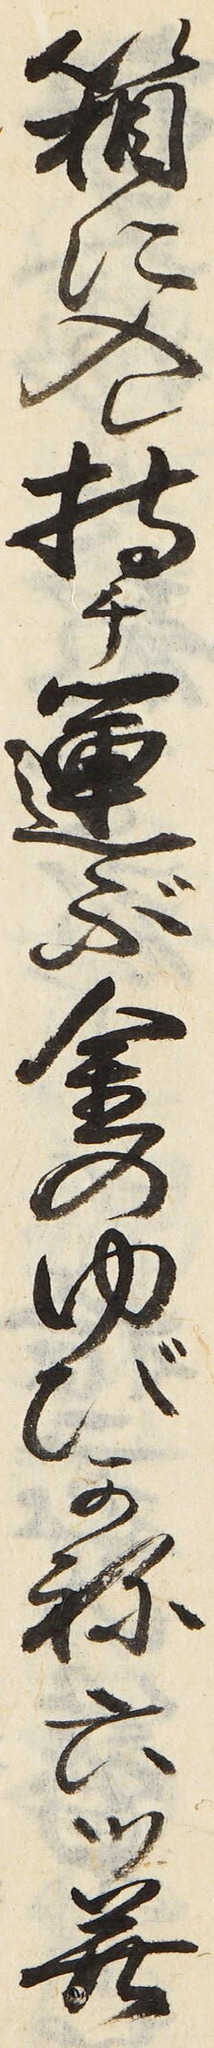箱に入れ持ち運ぶ金のゆびかね六ツ并
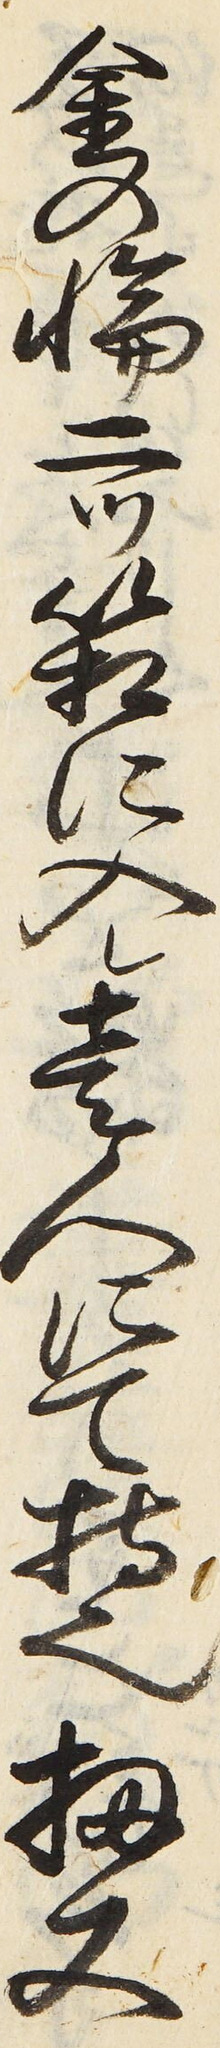金の輪二つ箱に入れ壱人にて持也扨又
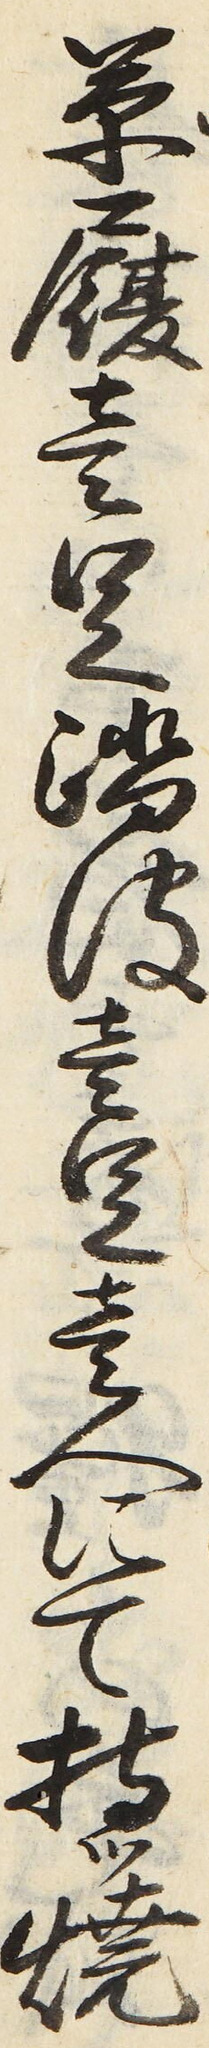草履壱足踏皮壱足壱人にて持つ焼
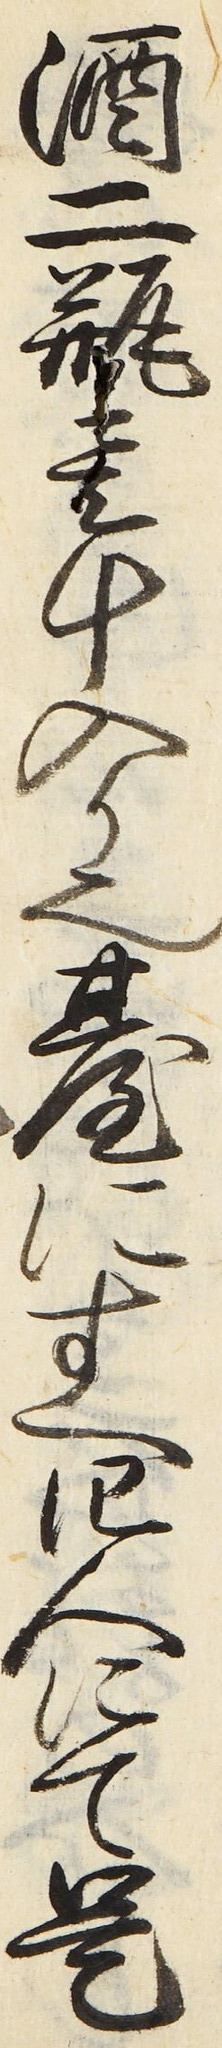酒二瓶壱斗入り也台にすへ四人にて是
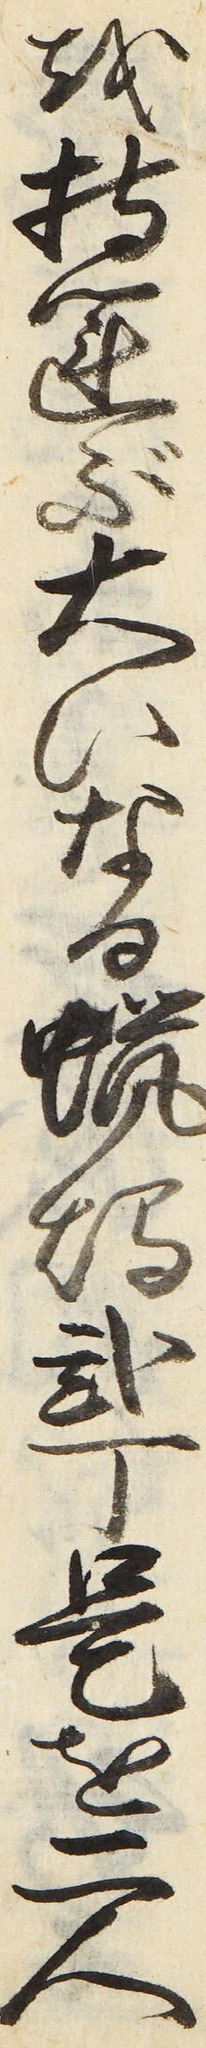を持運ぶ大ひなる蝋燭弐丁是を二人
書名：華夷九年録
